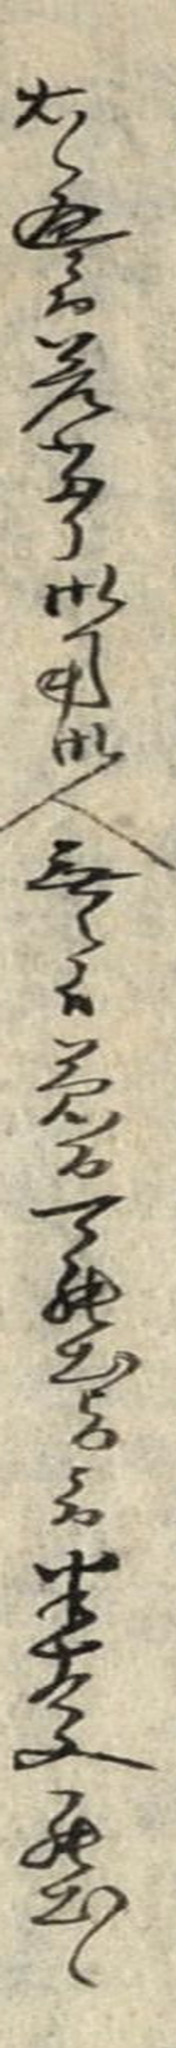右之通に付差当り御用御人無之候付兼而可罷出旨に付半太夫罷出候
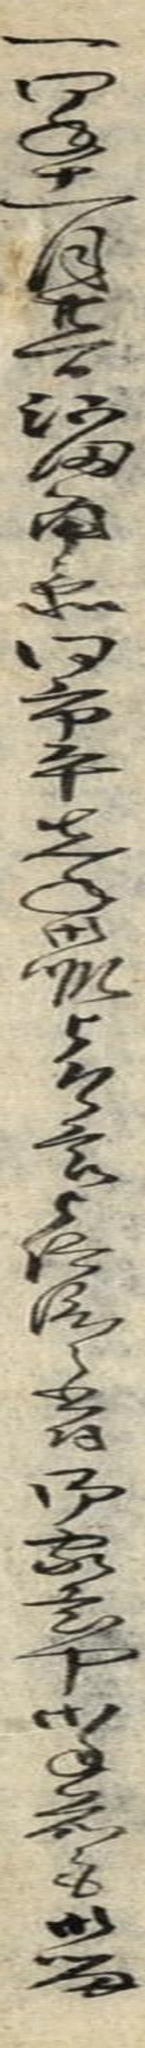一同年十一月廿一日沼田角兵衛同市平先年御暇被下候節被仰渡候書付御家老中御手前にも御留
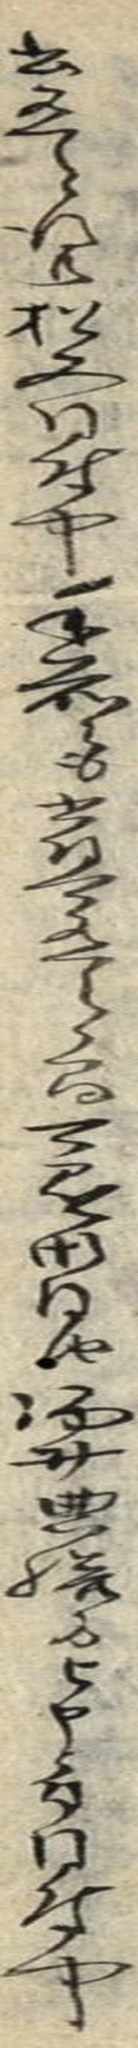書有之候得共猶又目付中手前にも書付可有之候間可懸御目由酒井典膳方被申付目付中
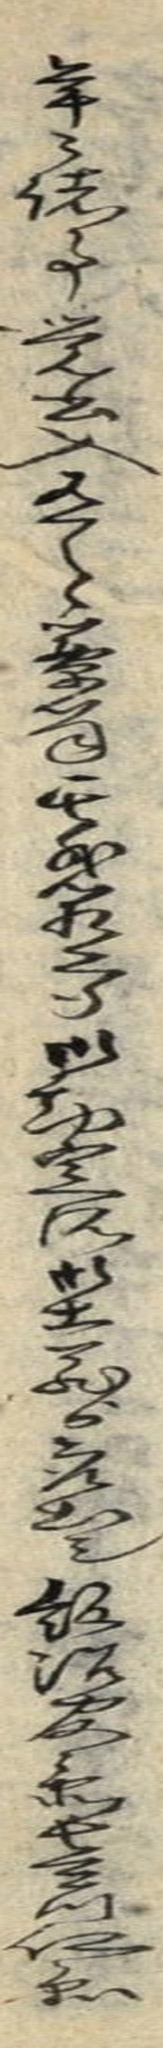年々諸事覚書入有之候箪笥其外箱二つ御勘定所御土蔵ゟ取出し飯沼官兵衛長谷川仁兵衛
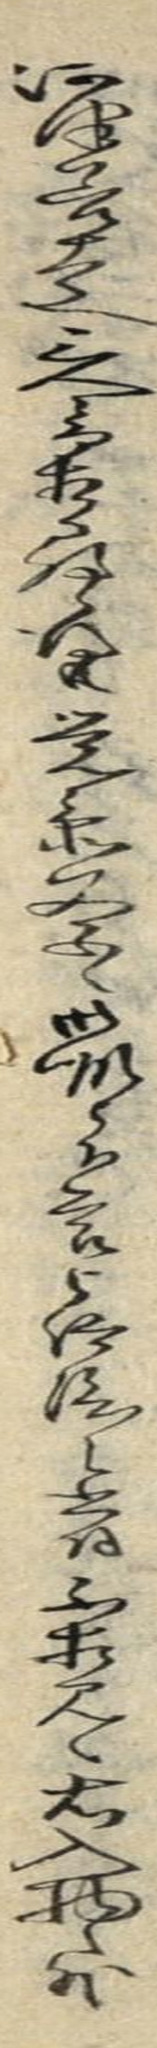河津源太夫三人に而相尋候得共覚兵衛父子へ御暇被下節被仰渡候書付不相見候右入物之外

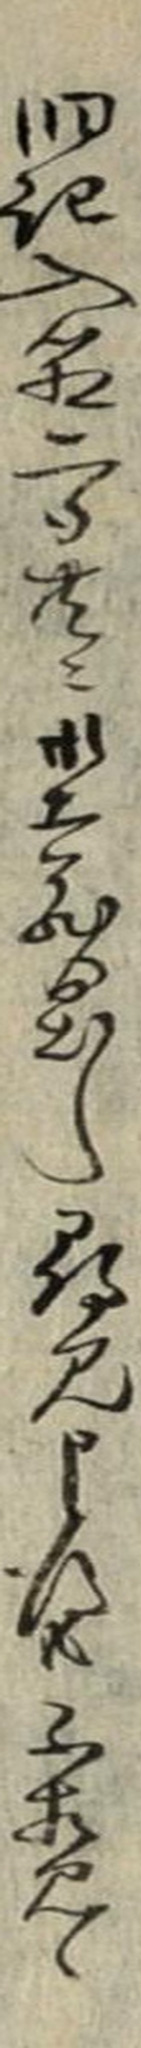御記入箱二つ共に御土蔵ゟ出し尋見候得共不相見候
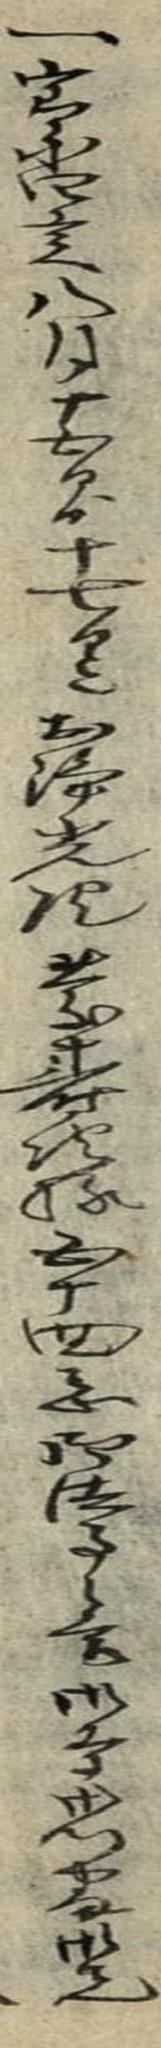一宝永四亥八月十五日ゟ十七日迄於浄光院慶寿院様五十四忌御法事之節御寺御門番御先
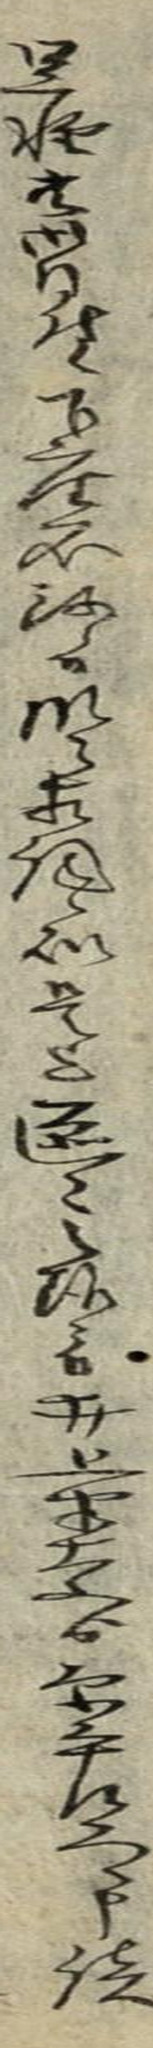足軽共御目付へ下座不致候付段々相調候処是迄區々之趣に付井上平太夫ゟ原平左衛門へ申談
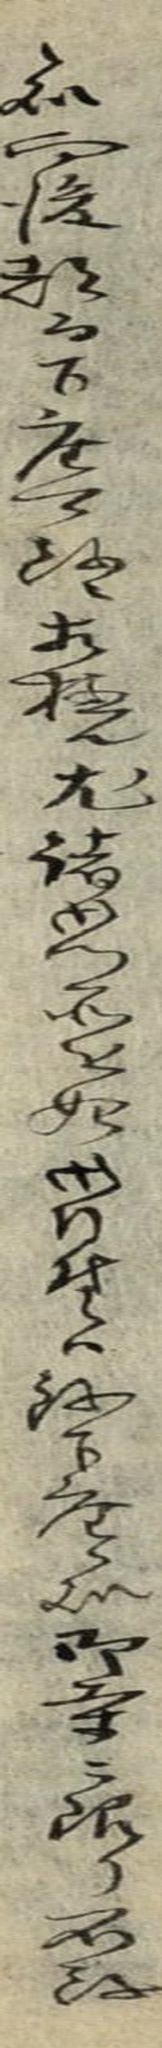候処向後都而下座可致に相極る尤諸御門所を始御目付へは致下座候処御寺に限り不致
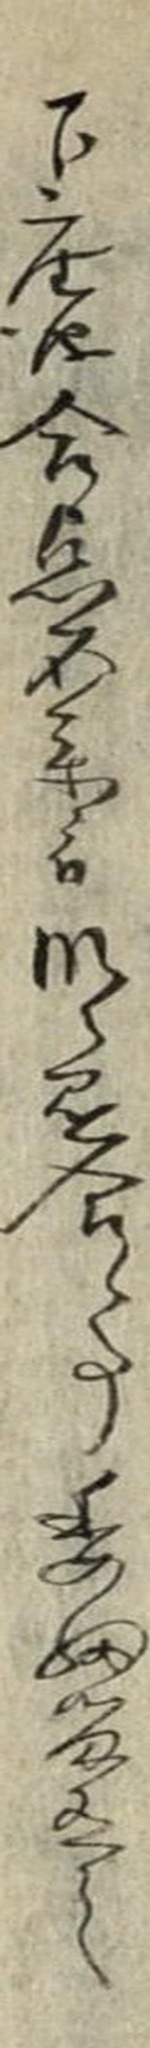下座儀合点不参に付段々懸合候事委細留有之
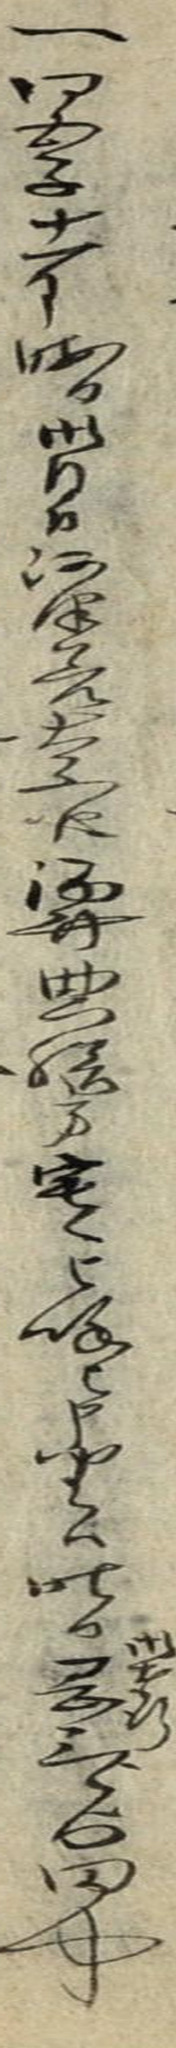一同五子十一月晦日御目付河津善太夫儀酒井典膳方宅へ被呼被申聞候は昨日御奉行岡三郎右衛門田中
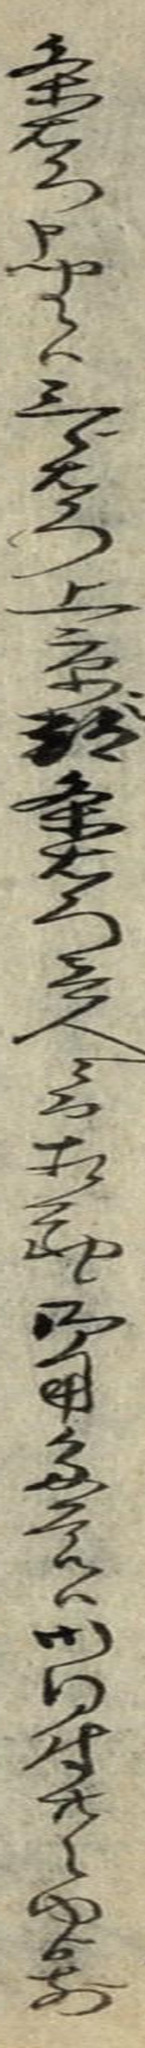粂右衛門申聞候は三郎右衛門上京之朝粂右衛門壱人に而相勤御用多之節は御目付共之内ゟ前
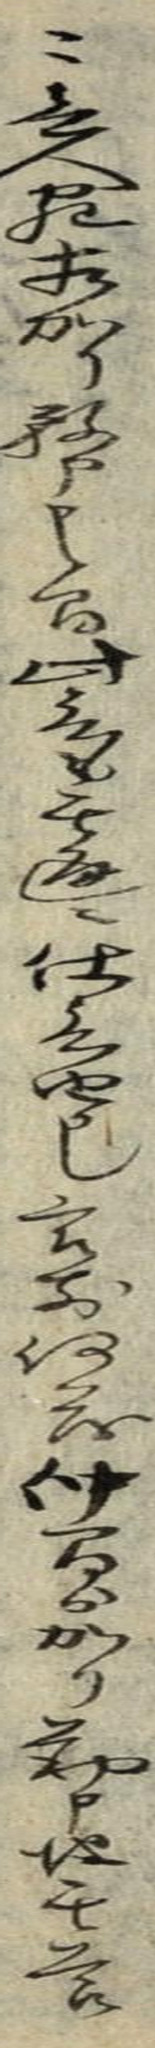々壱人宛相かり致申候間此度も其通に仕度由申候最前何も仲間ゟかり勤申儀其節
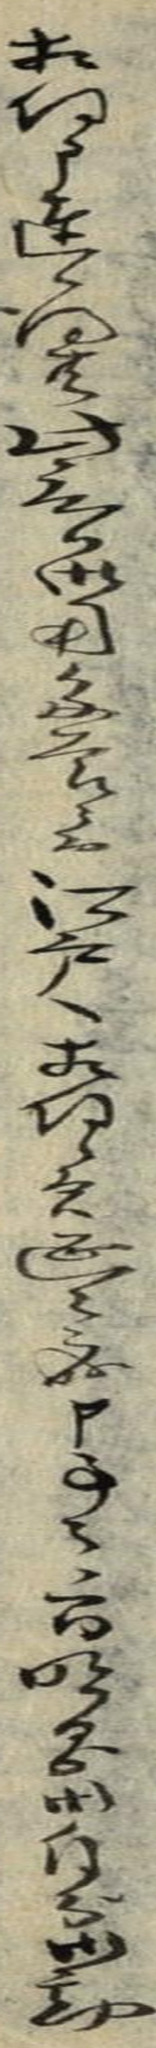相伺申達候得共此度は御用多節に而江戸へ相伺候而は延々に成申事に候間昨日ゟ御自分御勘
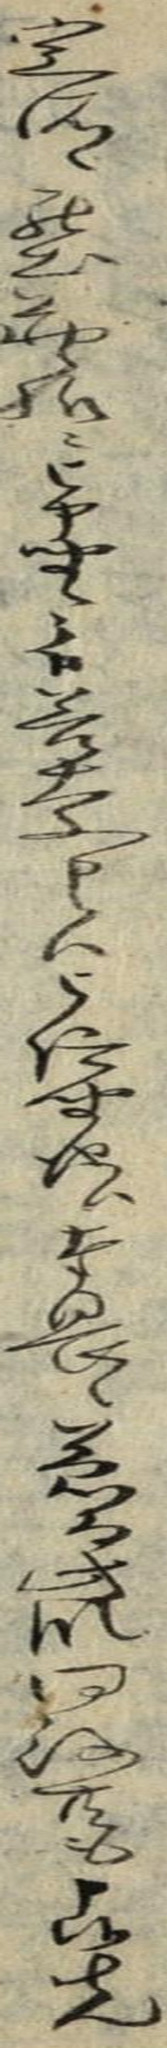定所へ罷出勤候様被申聞候に付善太夫申は被仰聞候儀は奉畏候兼而此段同役共も申候先
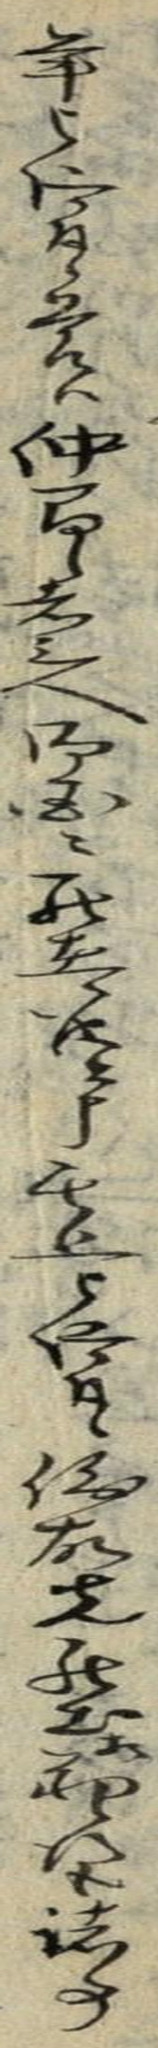年被仰付候節は仲間之者三人御国に罷在候儀と申其上被仰付故先罷出相勤候得共諸事
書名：蒐輯之部
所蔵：福井県文書館 Fukui Prefectural Archives
